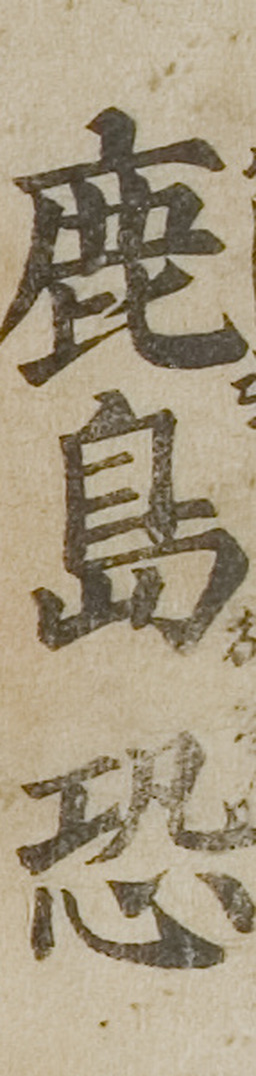鹿島恐
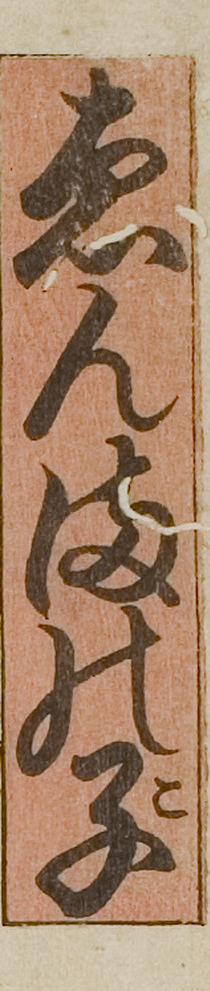ゑんまの子
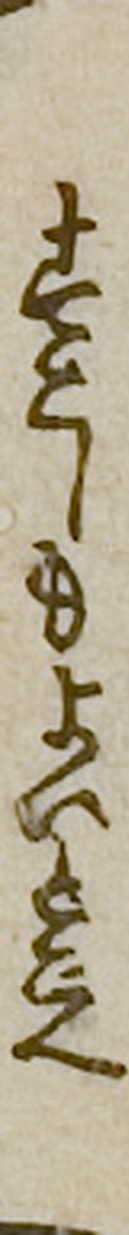すこしもよいとこへ
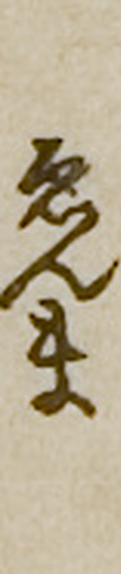ゑんま
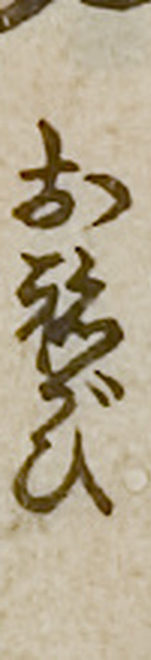おねがひ
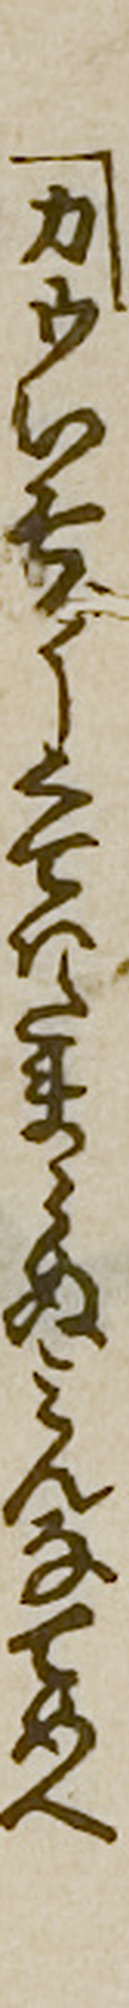〽カウいそかしくてはたまらぬみんなてめへ
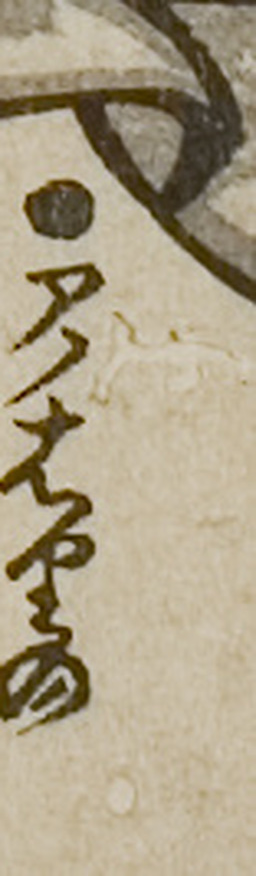アノはりの
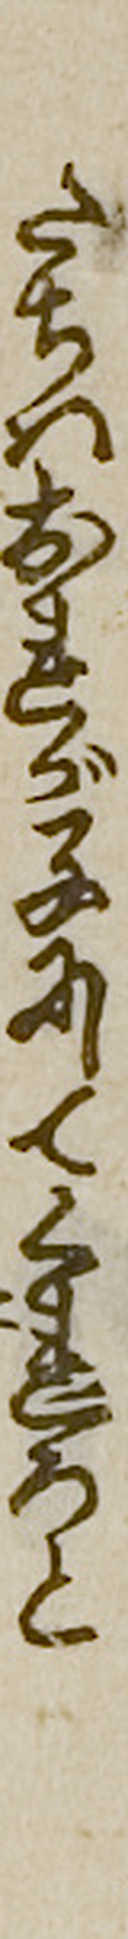たちはおれが子にしてくれろと
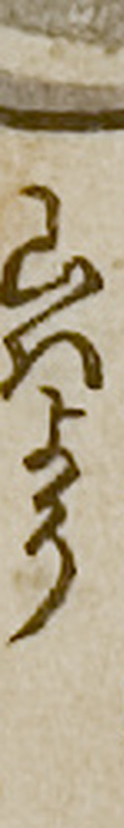山はよう
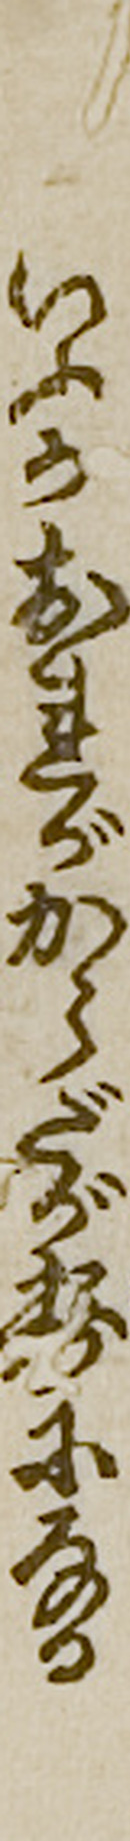いふかおれがからだが粉になる
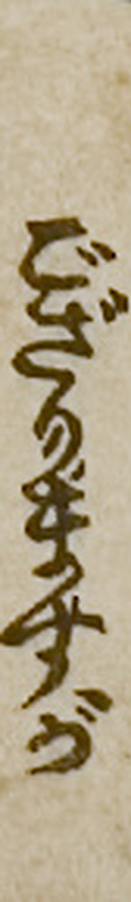ござりますが
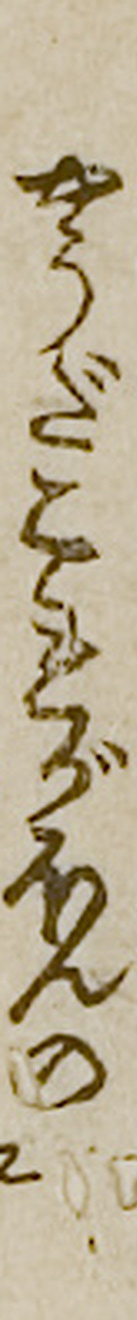やうだこれがほんの
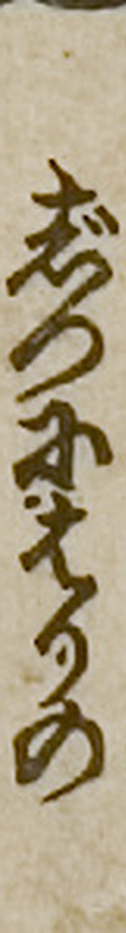じつにはりの
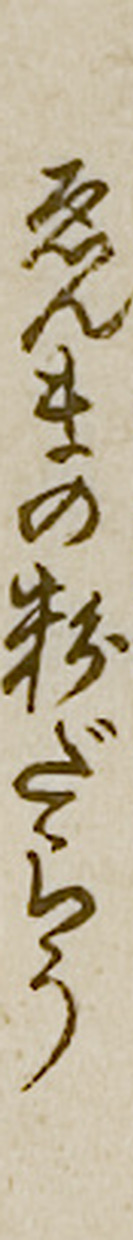ゑんまの粉だらう
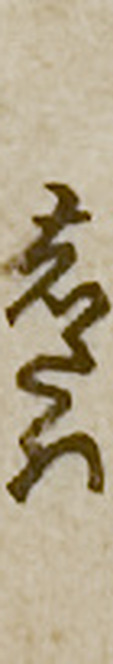したは
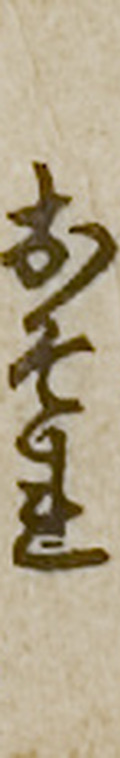おそれ
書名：ゑんまの子
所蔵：東京大学総合図書館 General Library in the University of Tokyo, JAPAN
